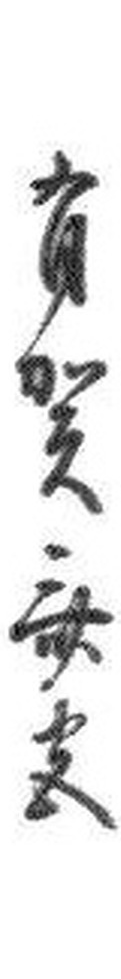有賀斎宮
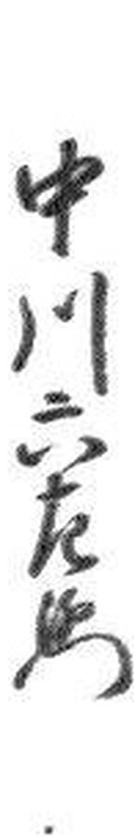中川六左衛門
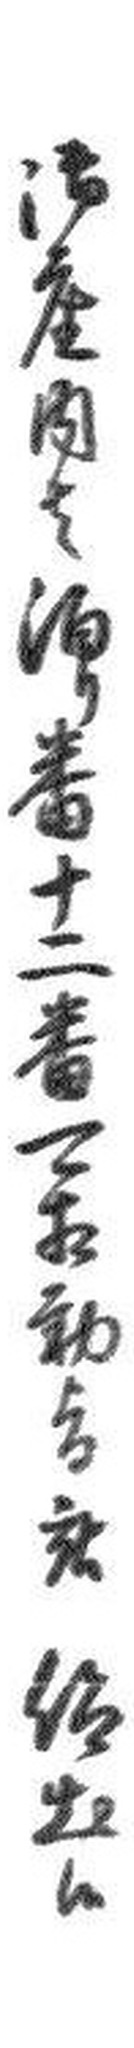御座内者泊り番十二番可相勤旨被仰出候
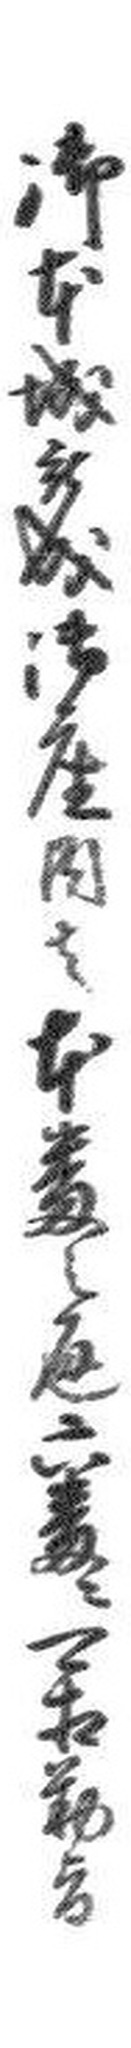御本城被成御座内者本番之通六番ニ可相勤旨
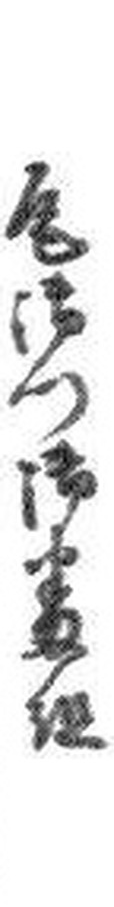瓦御門御番組
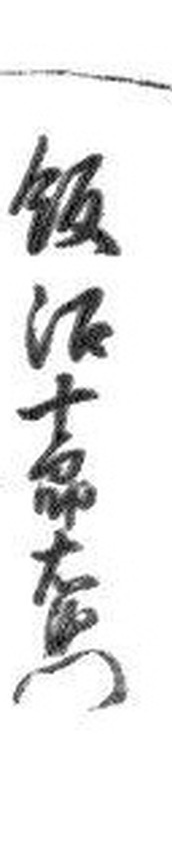飯沼十郎右衛門
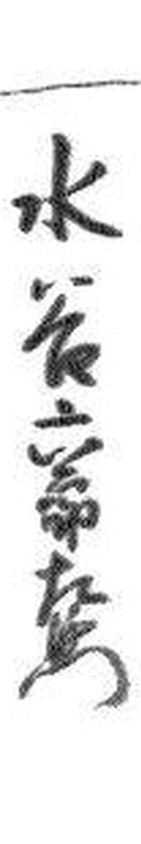水谷六郎左衛門
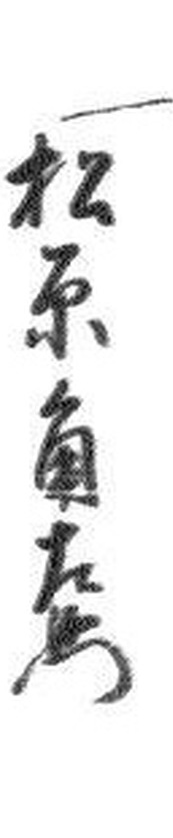松原角左衛門

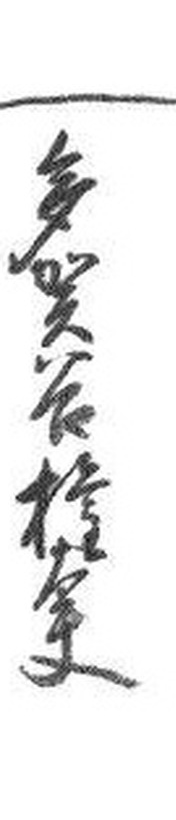多賀谷権太夫
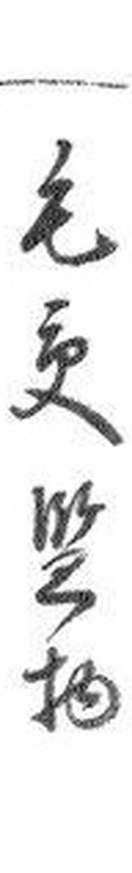毛受監物
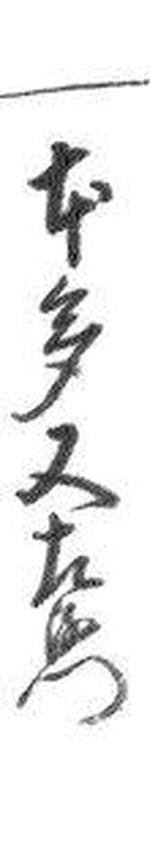本多又左衛門
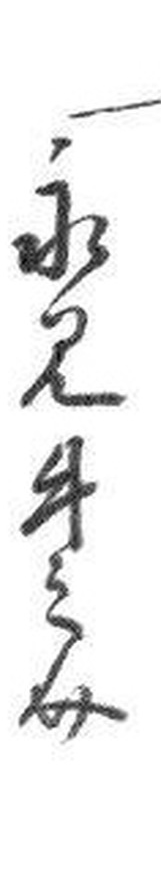永見牛之介
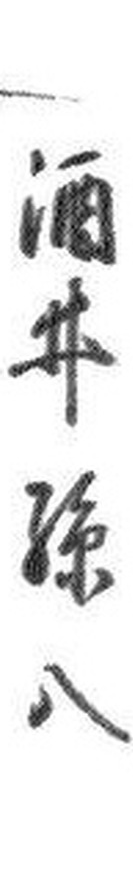酒井孫八
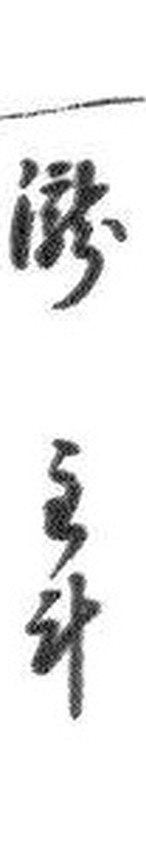瀧主計
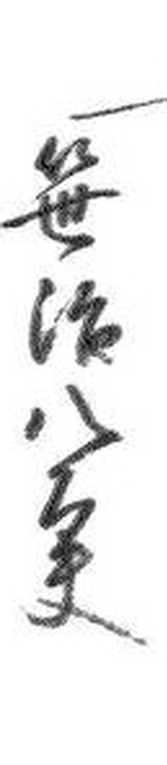笹治八太夫
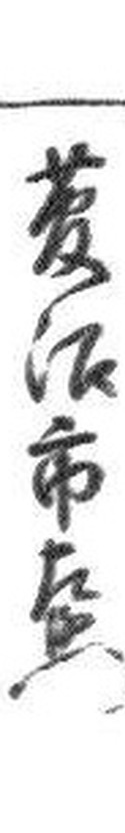菱沼市左衛門
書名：家譜 十一 昌親公 従延宝二年到延宝四年八月
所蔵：福井県文書館 Fukui Prefectural Archives
